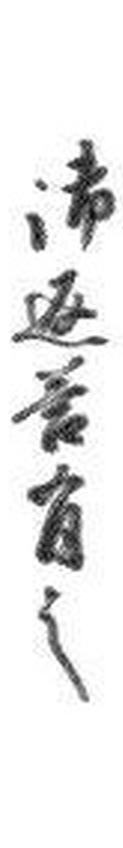御返答有之
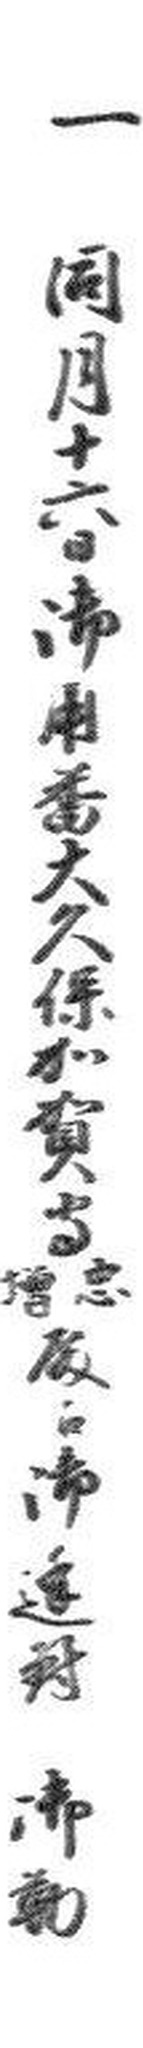一同月十六日御用番大久保加賀守忠増殿江御逢對御勤

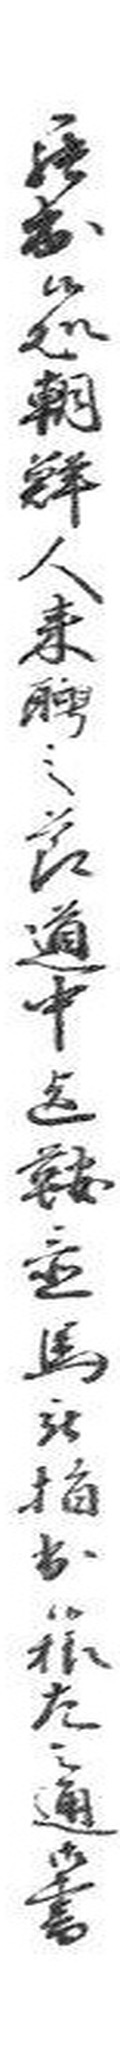罷出候処朝鮮人来聘之節道中迄鞍置馬被指出候様左之通御書
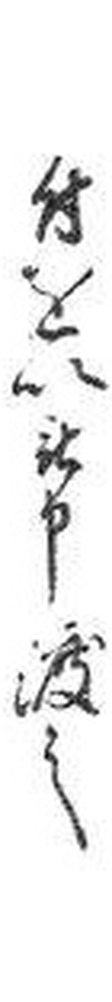付を以被申渡之
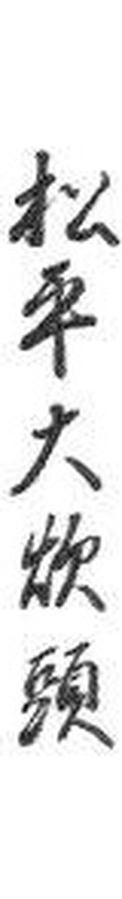松平大炊頭
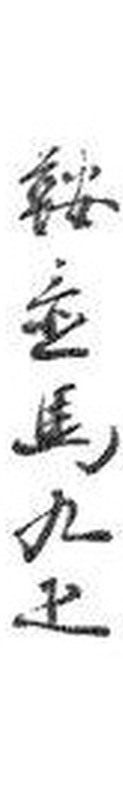鞍置馬九疋
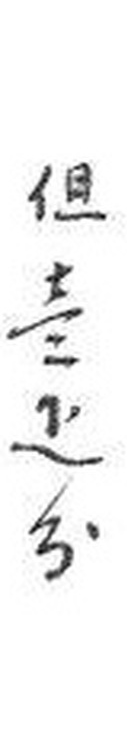但壱疋分
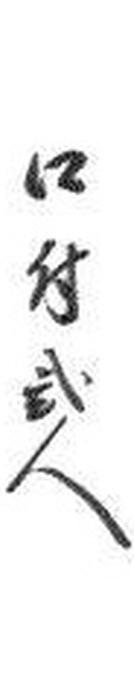口付壱人
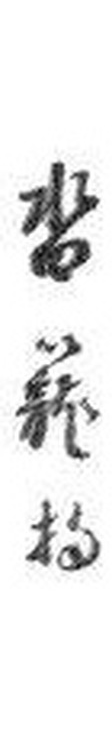轡籠持
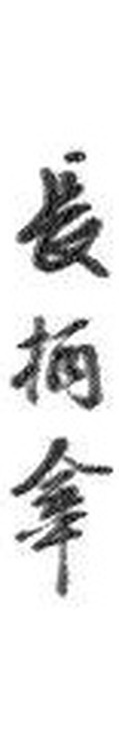長柄傘
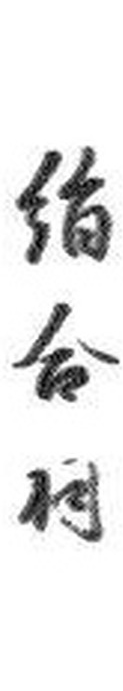絹合羽
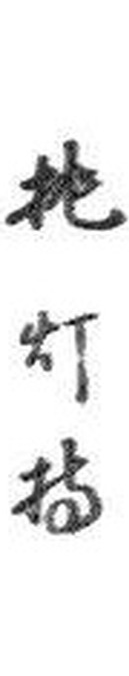挑灯持
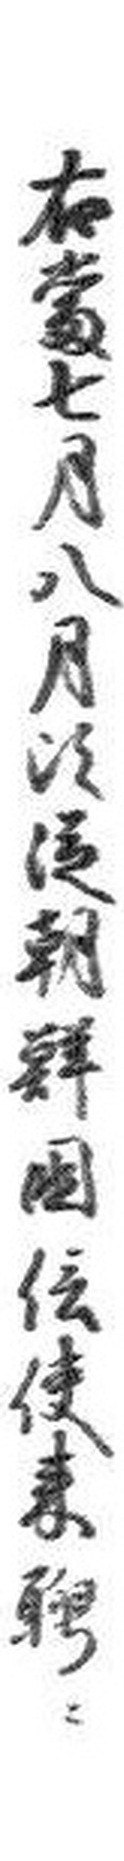右当七月八月頃従朝鮮国信使来聘ニ
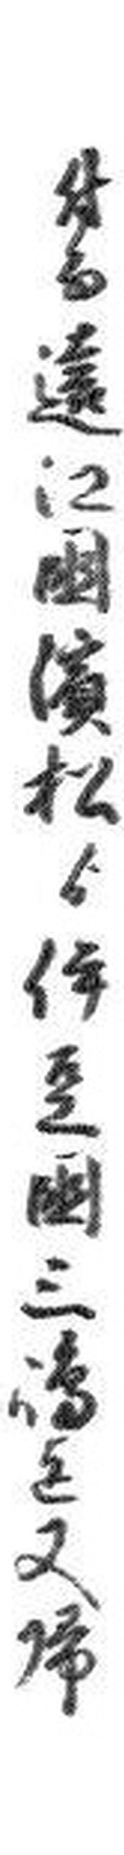付而遠江国浜松ゟ伊豆国三島迄又帰
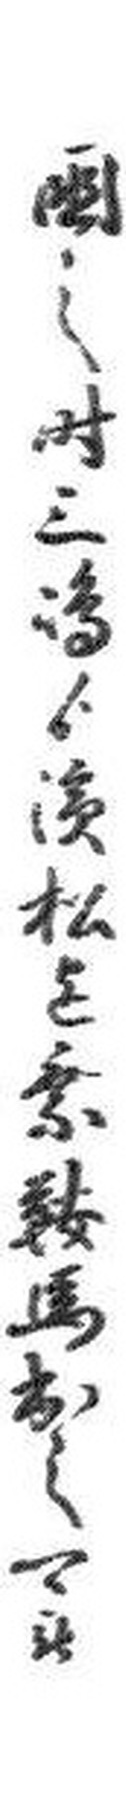国之時三島ゟ浜松迄乗鞍馬出之可被
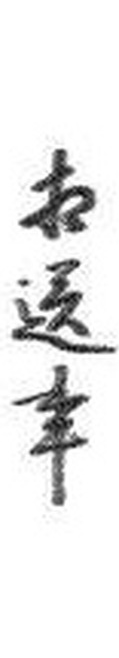相送事
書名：家譜 二十八 吉邦公 従宝永七年七月五日到正徳元年十二月
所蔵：福井県文書館 Fukui Prefectural Archives
